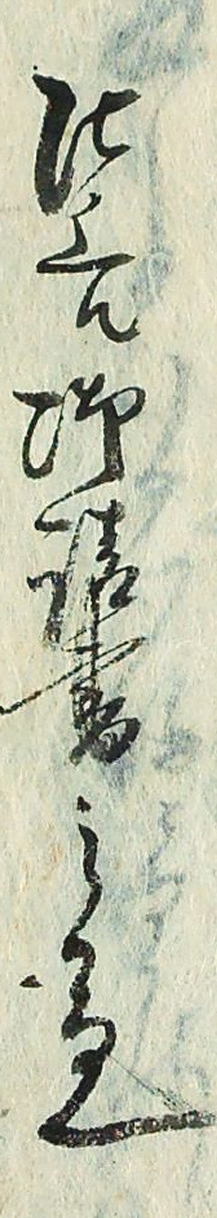仕上ル御請書之覚
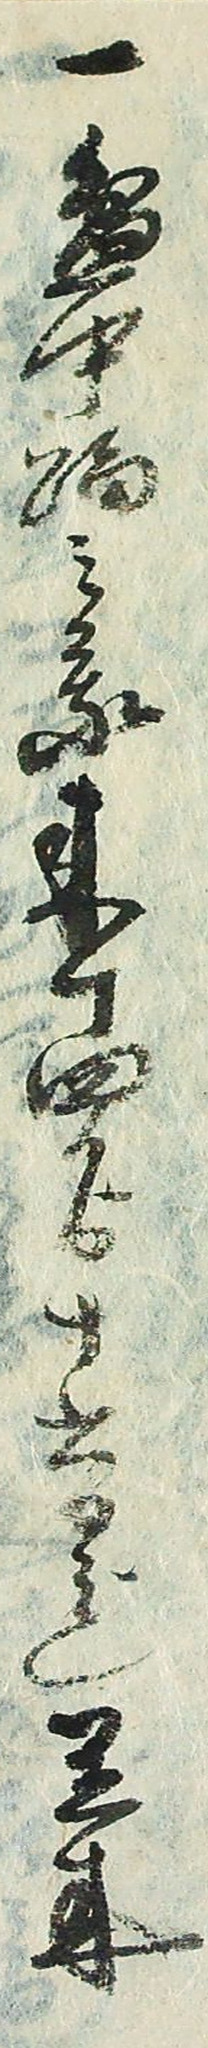盆中踊之義来十四日ゟ十六日迄有来
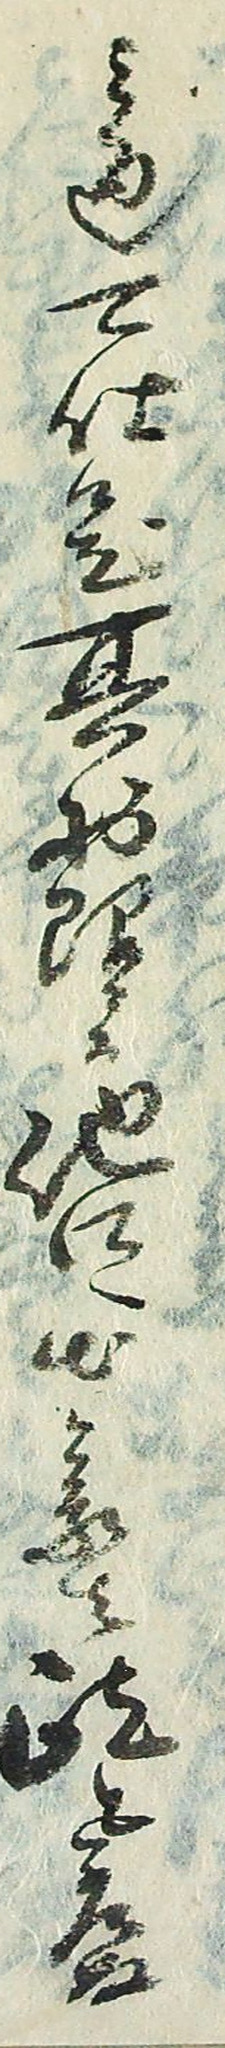之通可仕候尤其村限に而他郷へ出候義は屹と差留
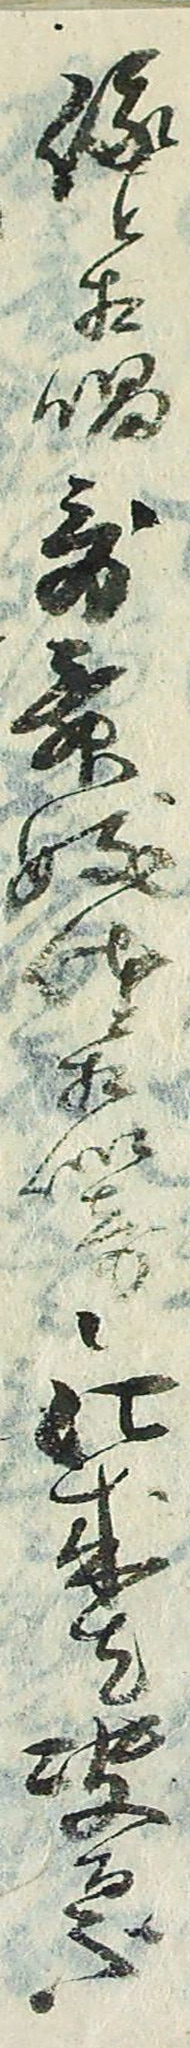俄と相唱哥舞妓体に相似寄候仕成は決而不
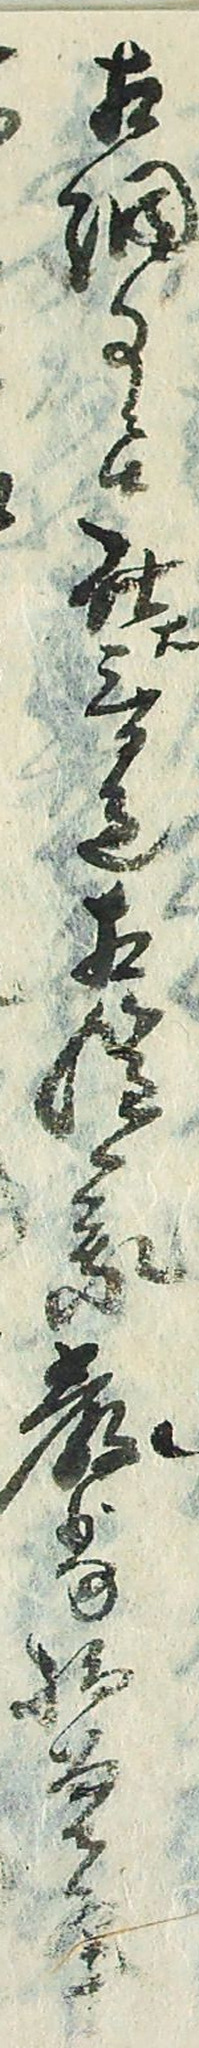相調事に候此右三日過相催候義厳布指留候条
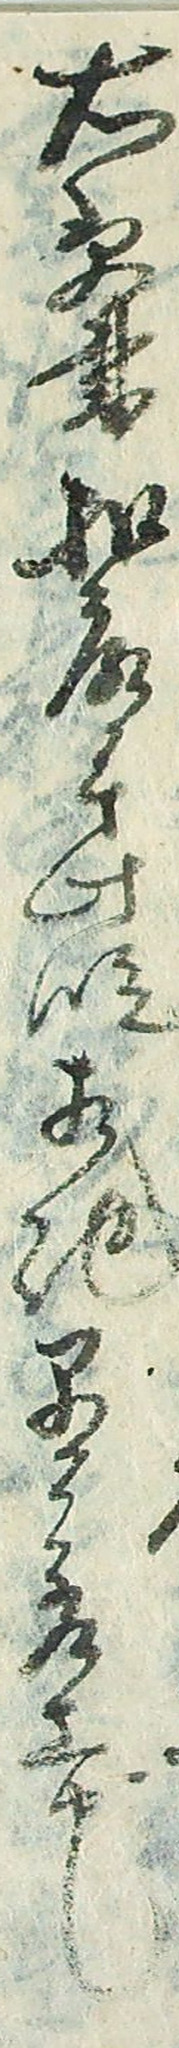右受書扣に取候付此段相記早々差上申候

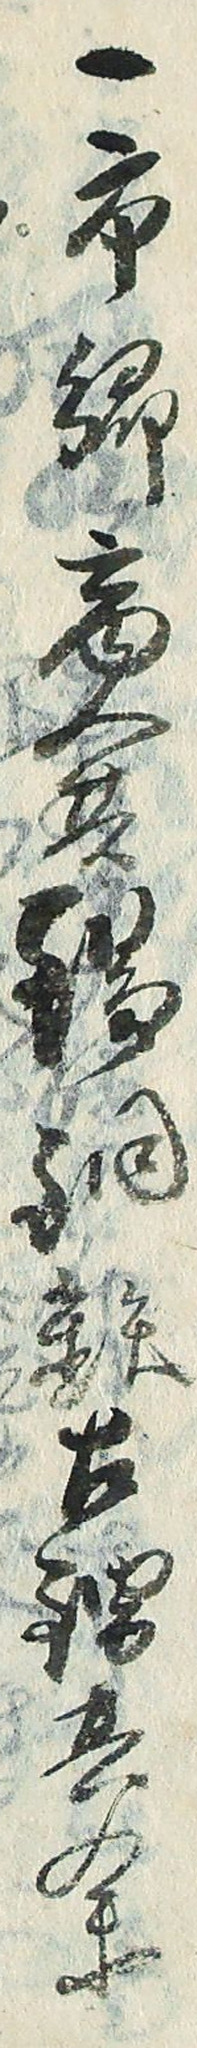一市郷商人共錫銅鉄古鍋其余
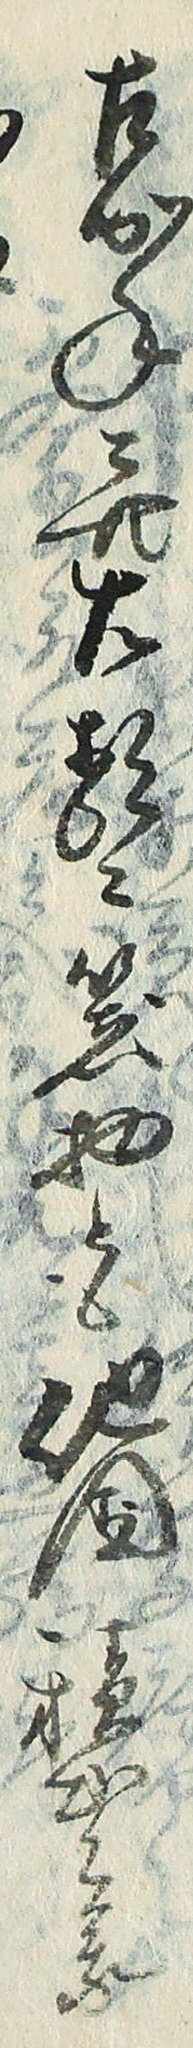古かね幷右類々器物とも他国積出之義
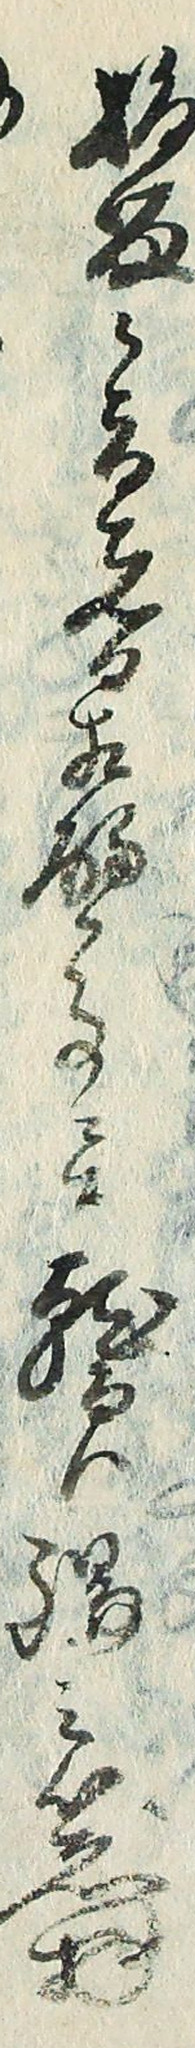指留候旨先日相触候事に候就而は錫之器物
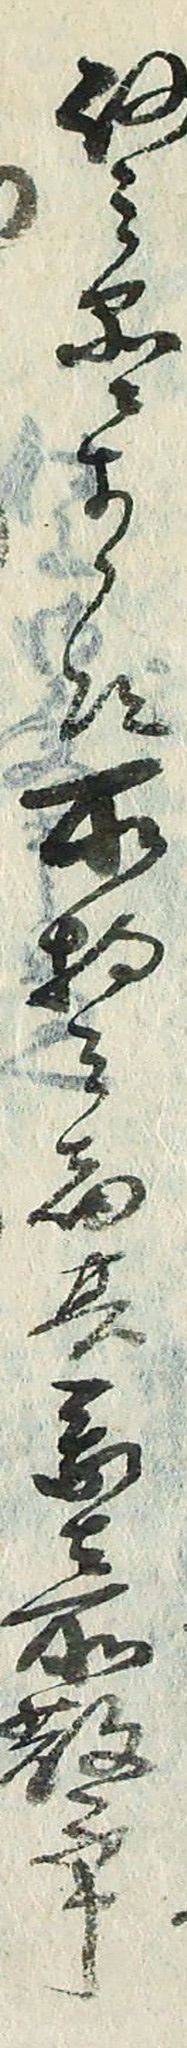何之品によらす所持之者其義は所散不申
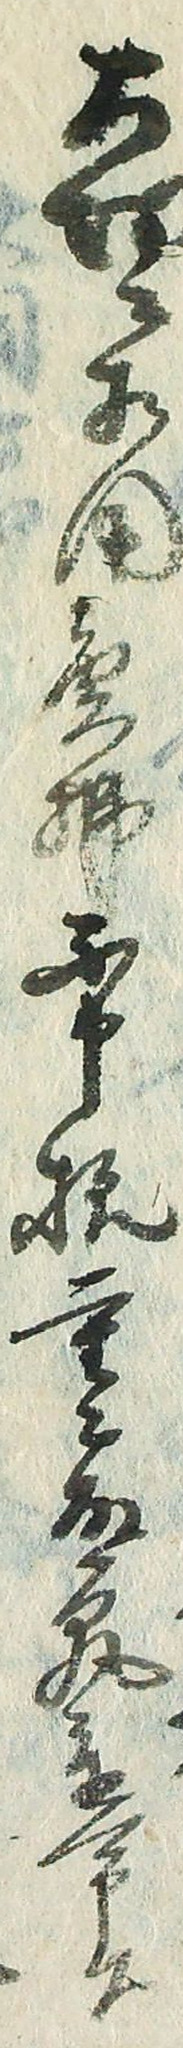大切に相用売払不申様重々取究置可申候
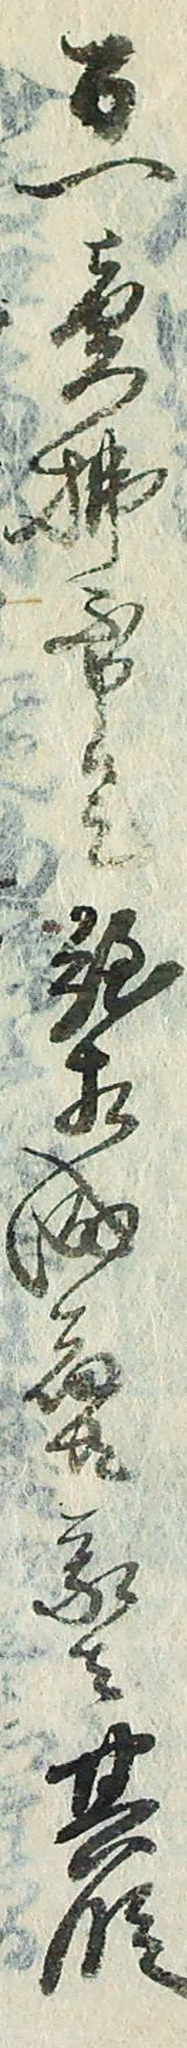万一売払不申候は難相成者共義は其段
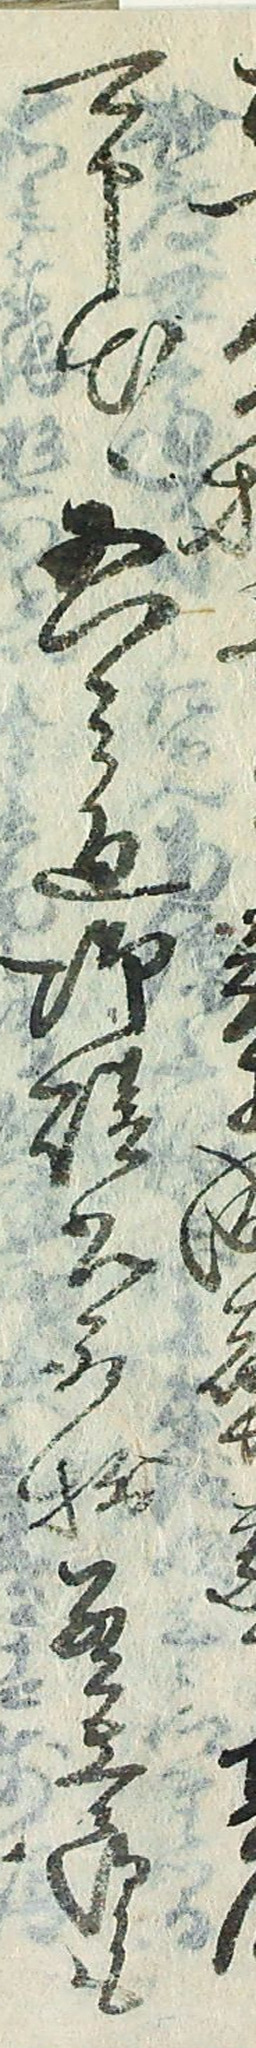可申出候右之通御請書取揃差上候得とも
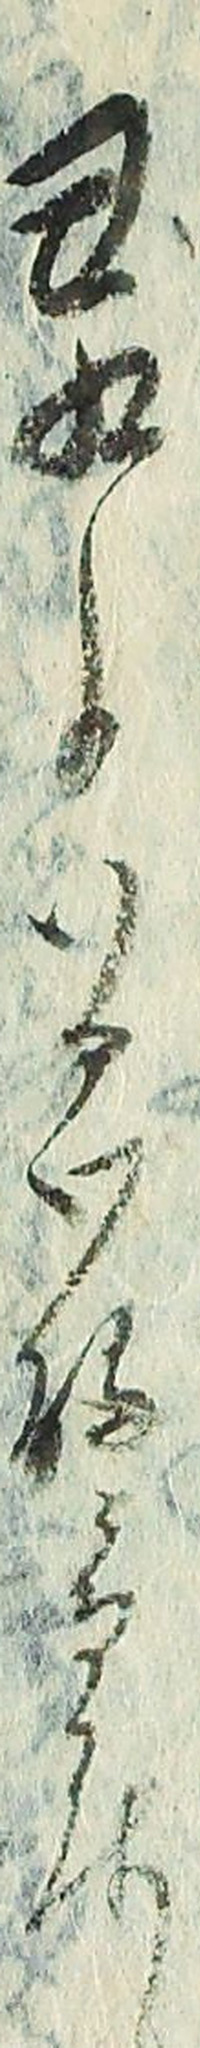丑九月八日御触に御座候
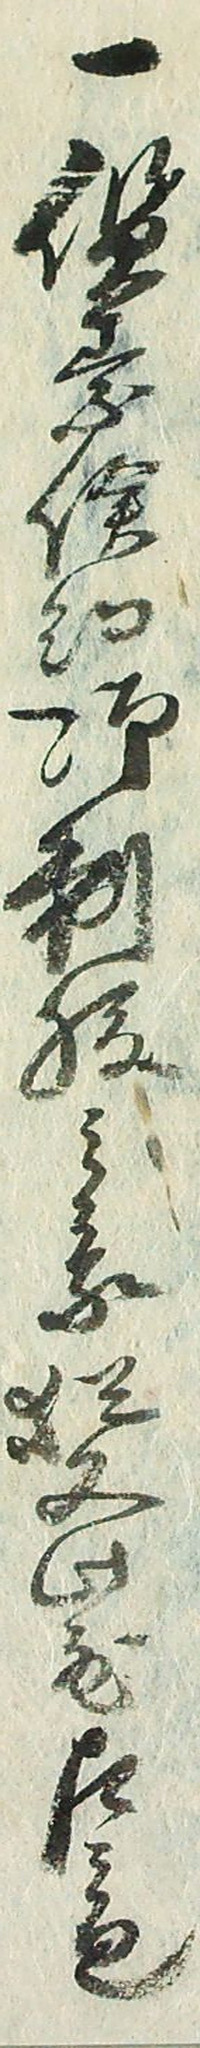一質素倹約御制服之義猶又此度左之通
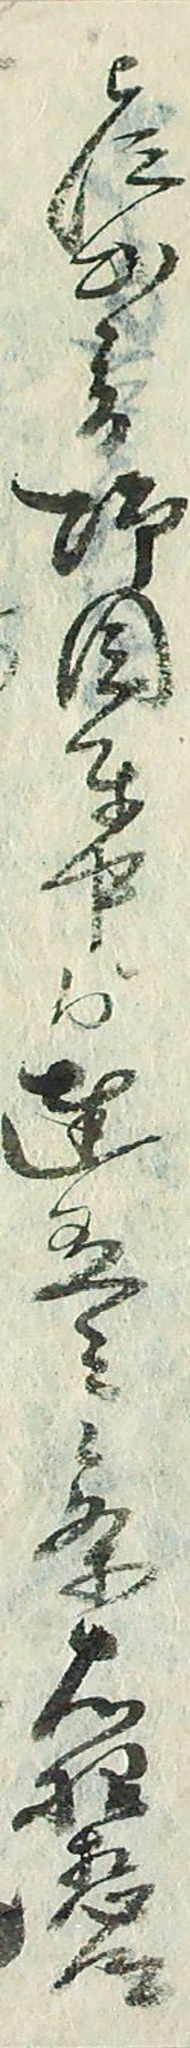被仰出候旨御目付中ゟ達有之候条右様相心得
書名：諸御用御□受書控
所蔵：鳴門教育大学 Naruto University of Education
